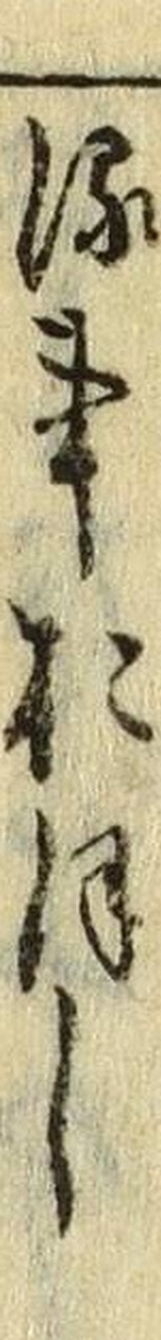る事おほし
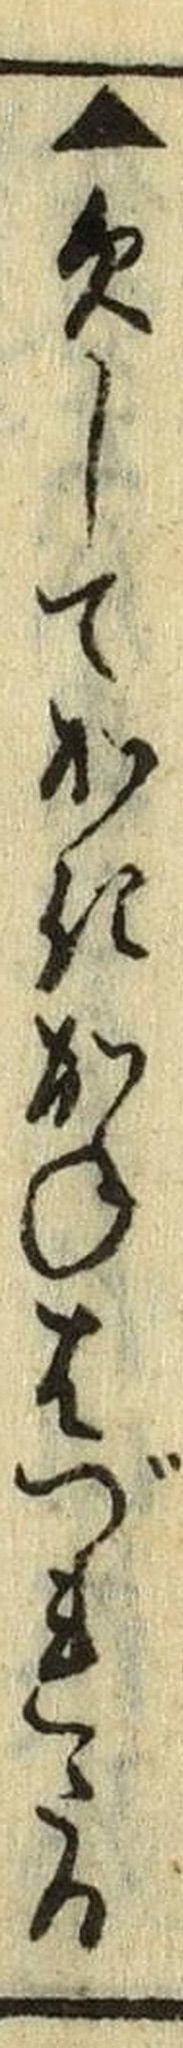▲欠してかきかねはづれたる
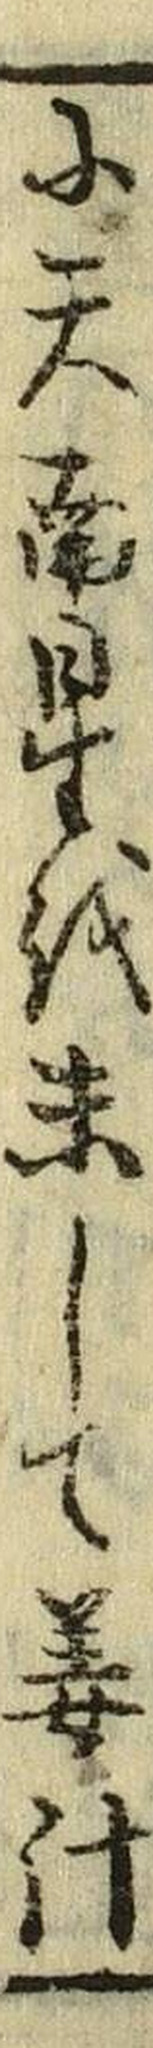に天南星を末して姜汁
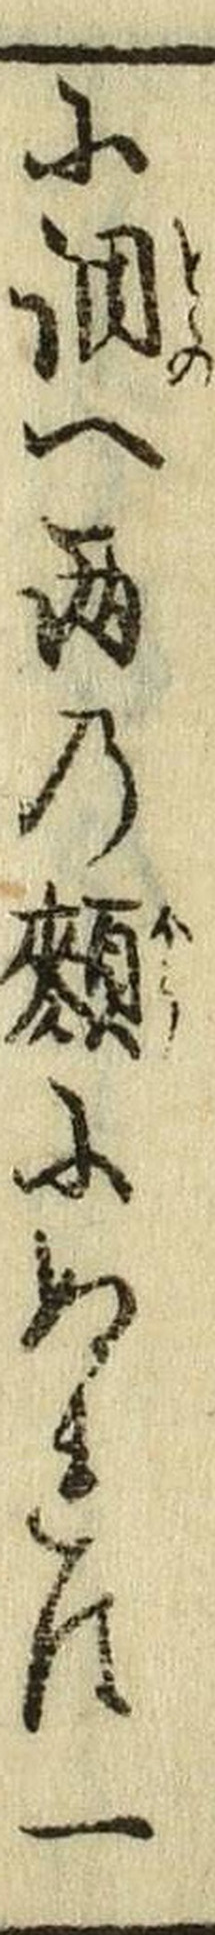に調へ両の頬にぬれは一
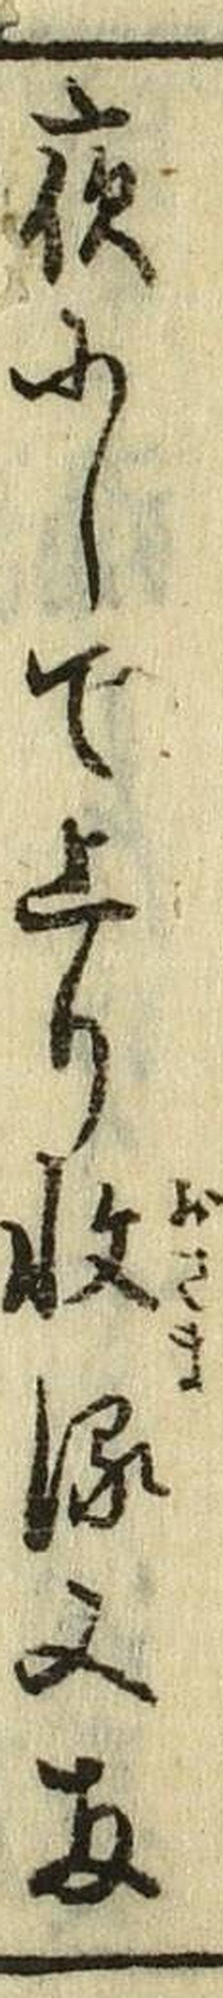夜にして上り收る又両
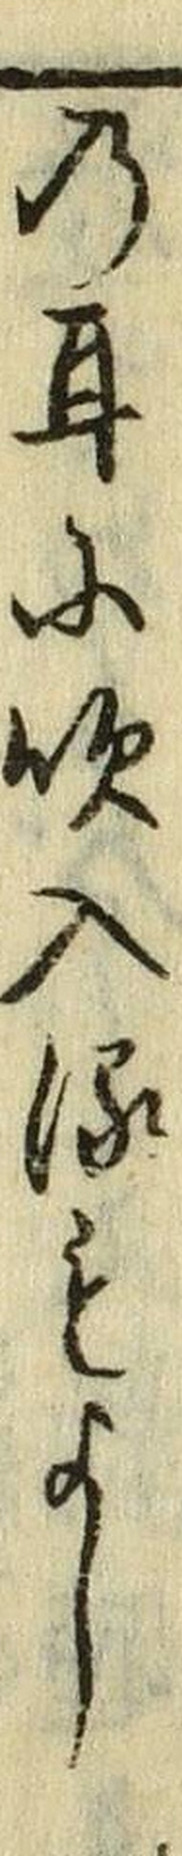の耳に吹入るもよし
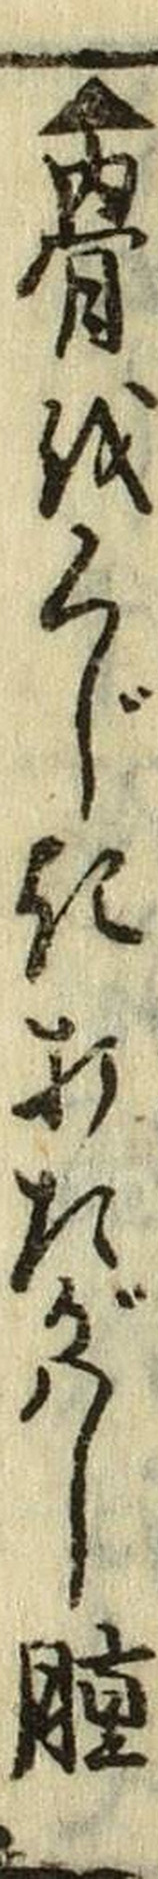▲骨をくじき打たがはし腫
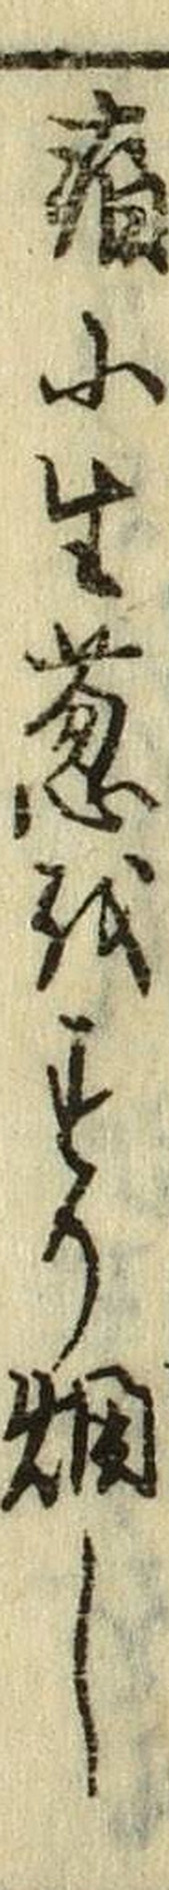痛に生葱をすり爛し
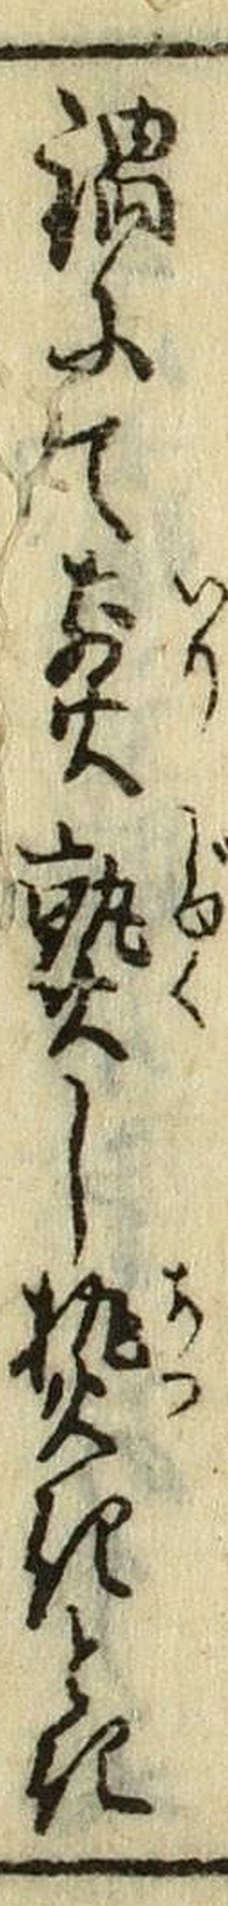鍋にて煎熟し熱きとき
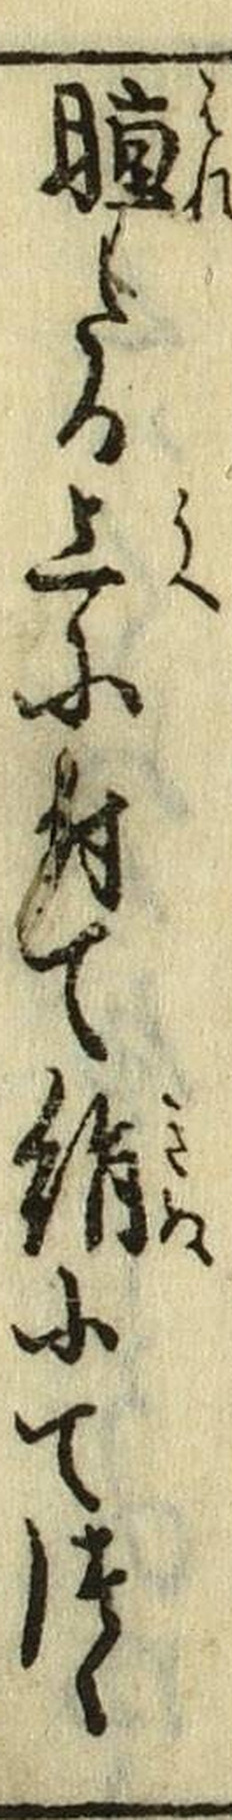腫たる上に付て絹にてつゝ
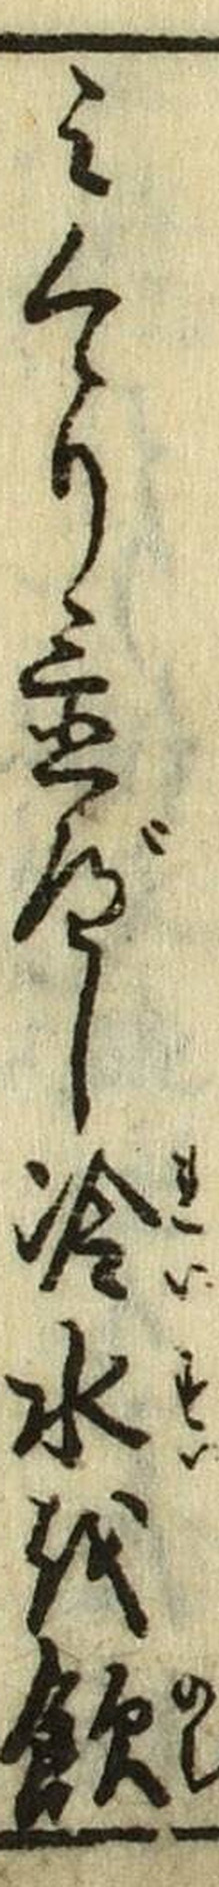みくゝり置べし冷水を飲
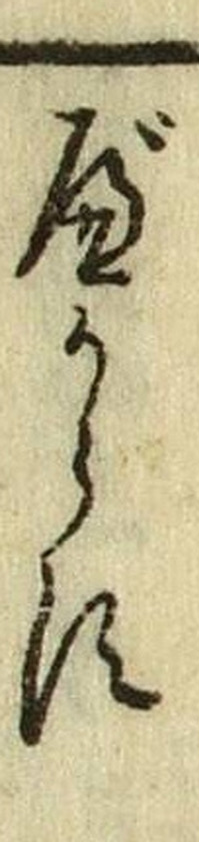べからす

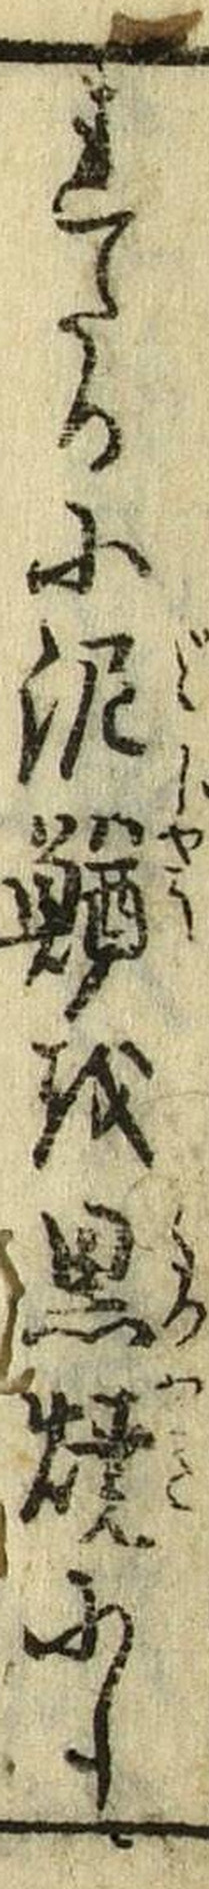れたるに泥鰌を黒焼にし
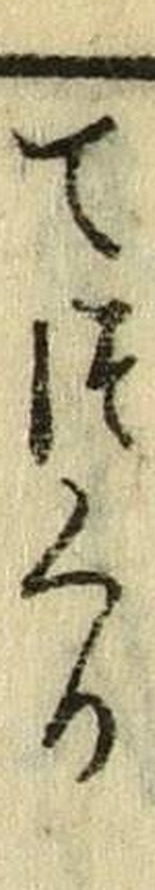てつくる
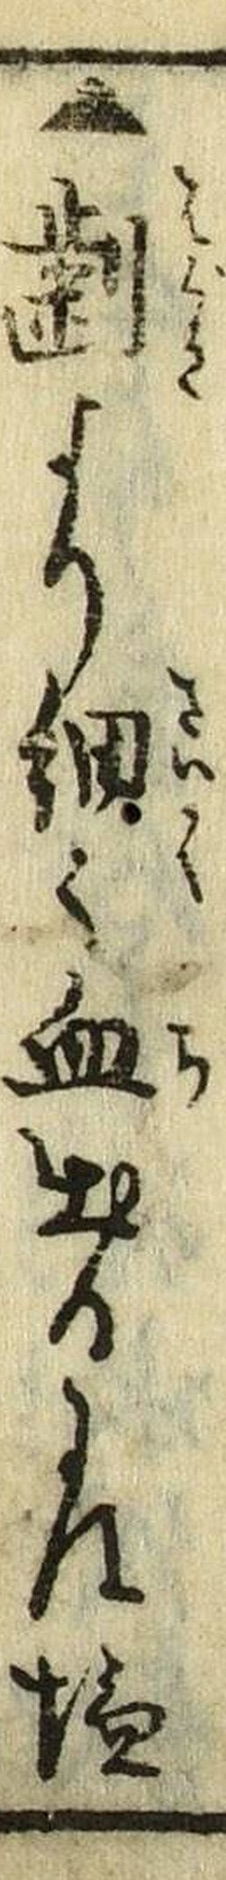▲齦より細々血出るには塩
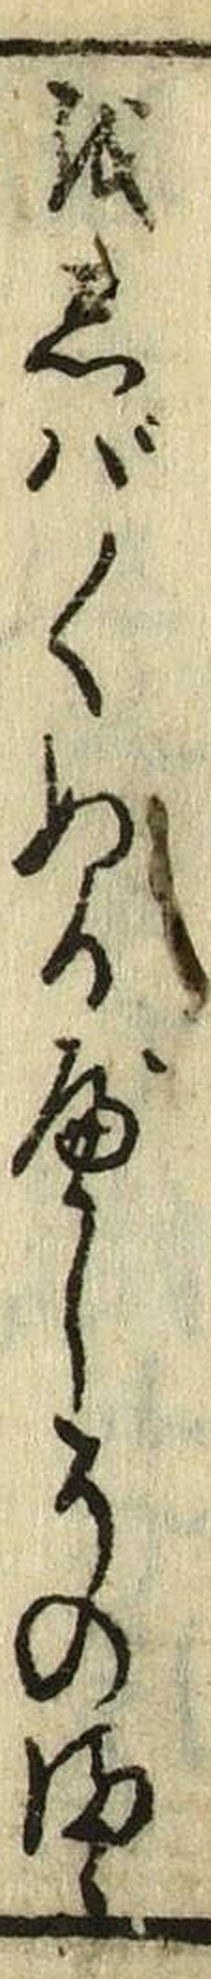をしば〳〵ぬるへしそのまゝ
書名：居家養生記
